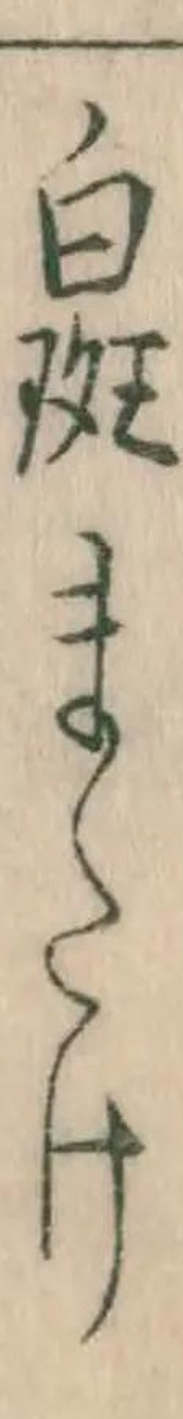白斑またけ
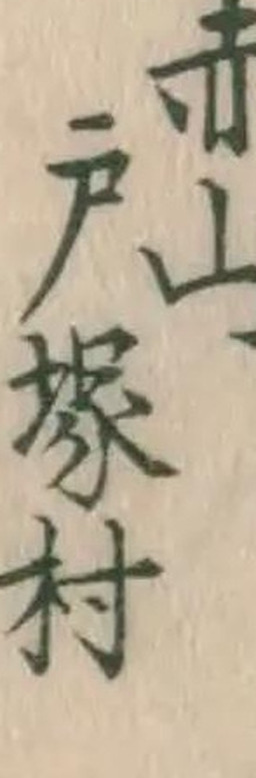戸塚村
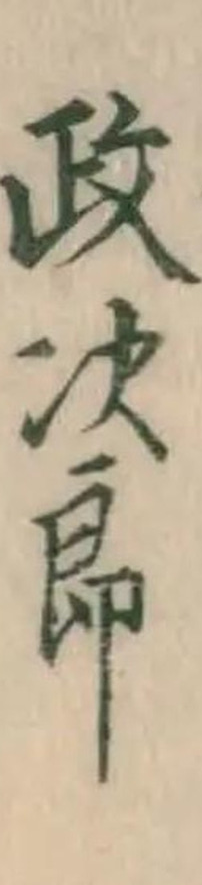政次郎
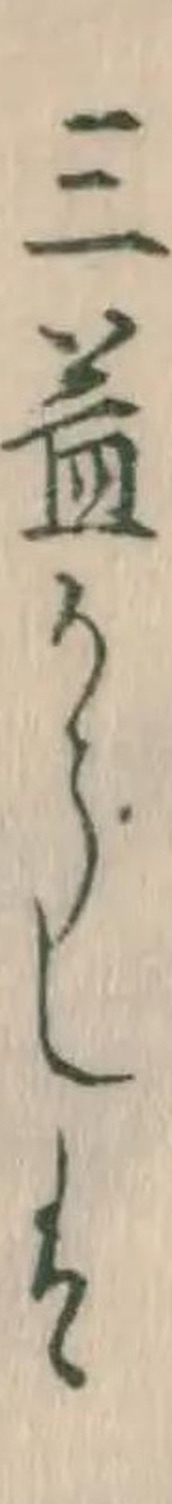三益かうしは
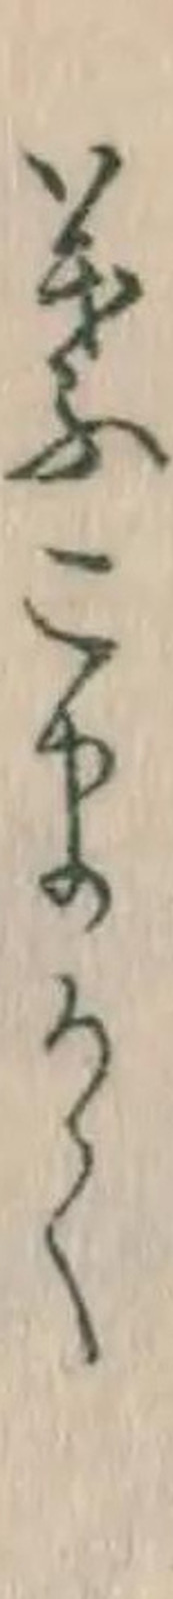葉こまかく
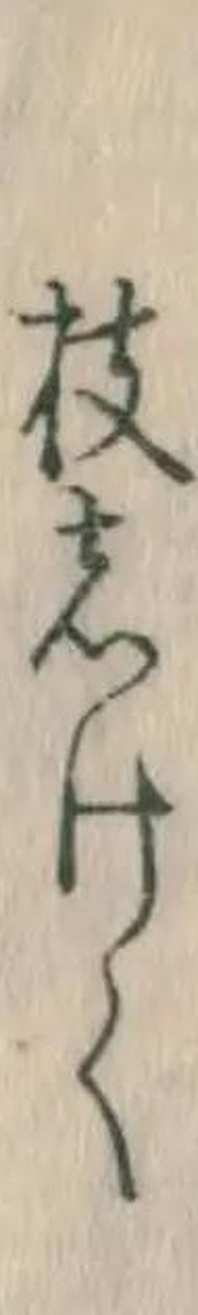枝しけく
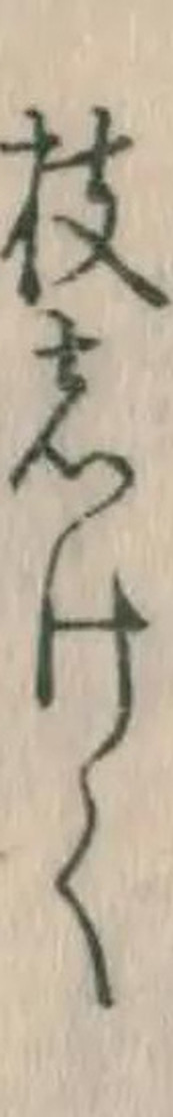枝しけく
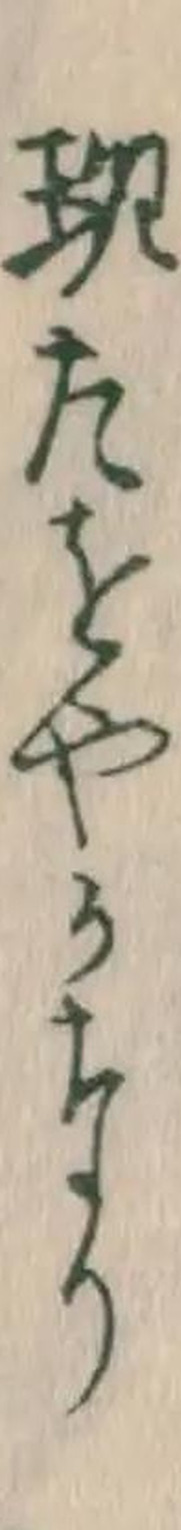斑たをやかなり
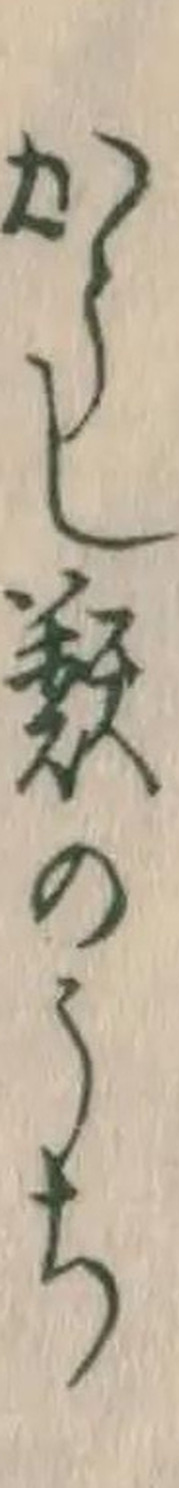かうし類のうち
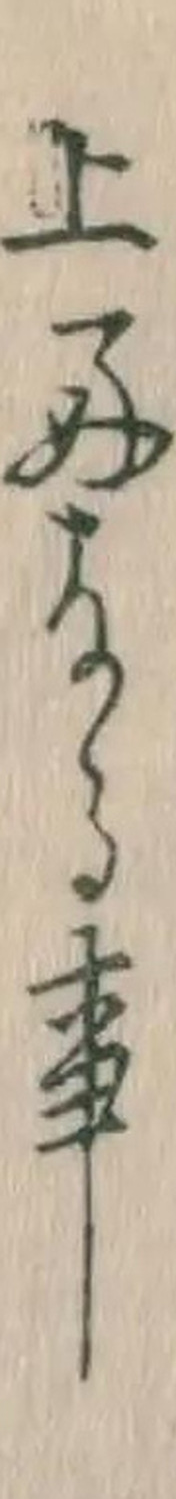上好なる事
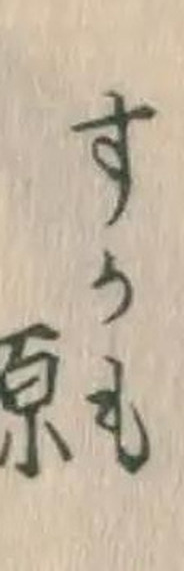すかも
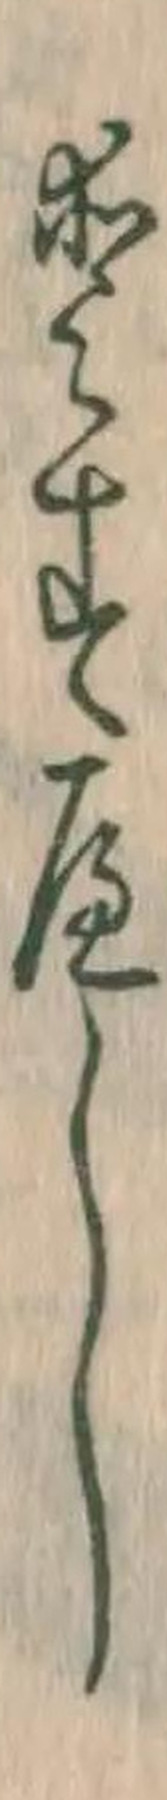愛すへし
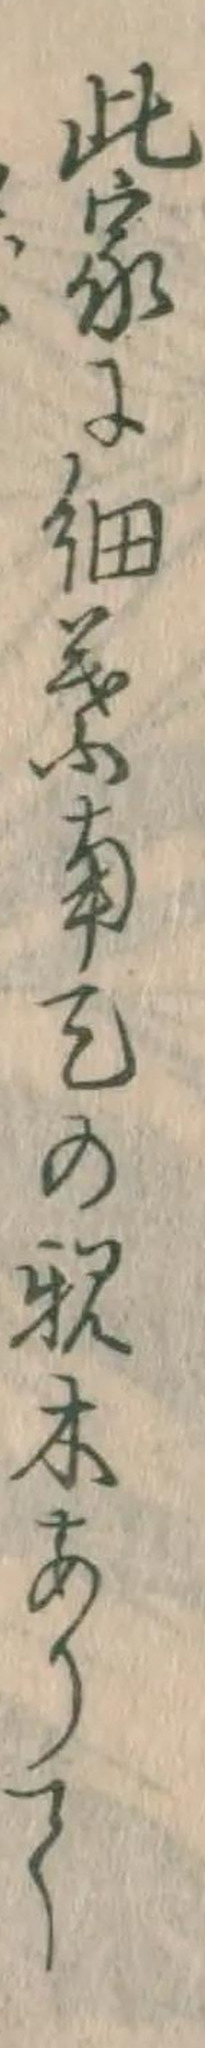此家に細葉南天の親木ありて
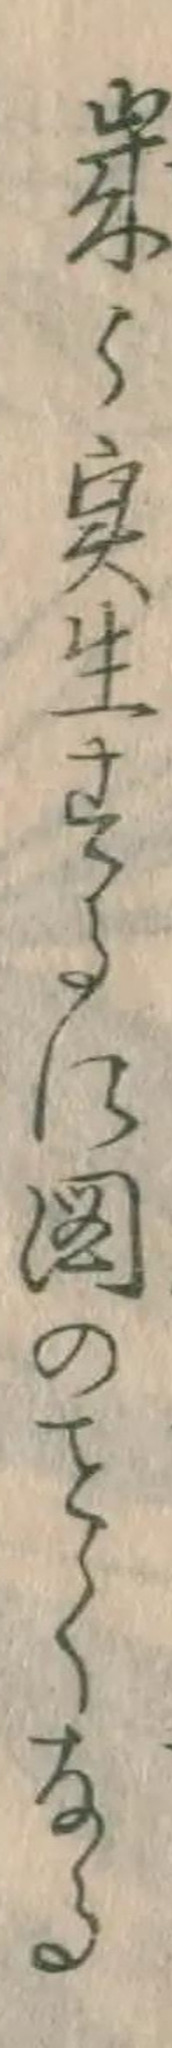歳々実生するに図のことくなる
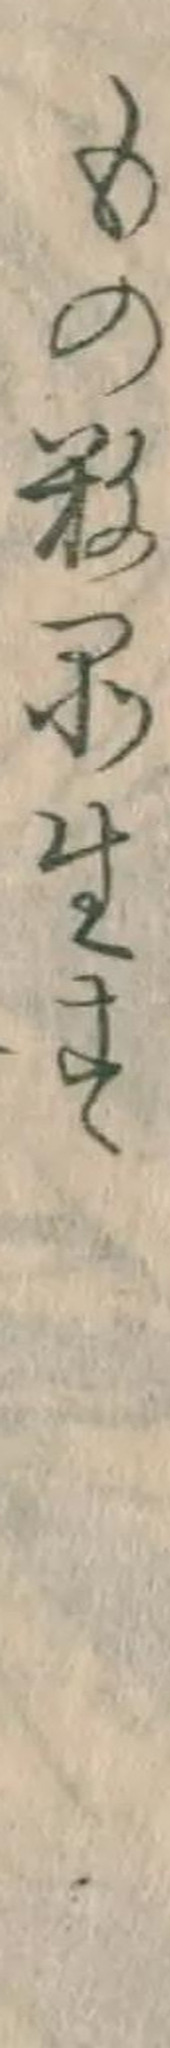もの数品生す
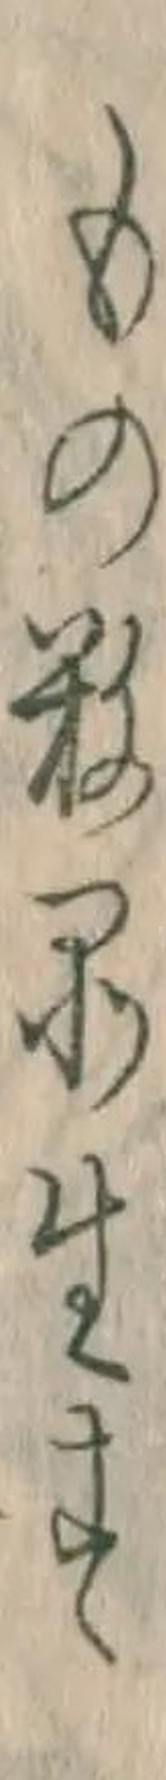もの数品生す
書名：草木奇品家雅見 3巻. [3]
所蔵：国立国会図書館 National Diet Library, JAPAN
